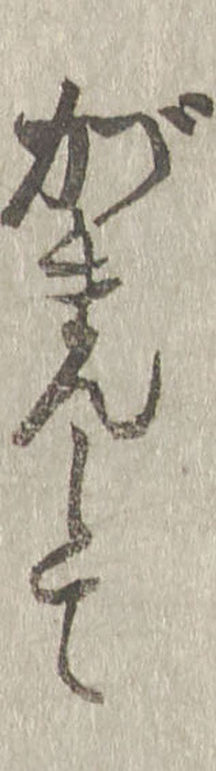がまんして
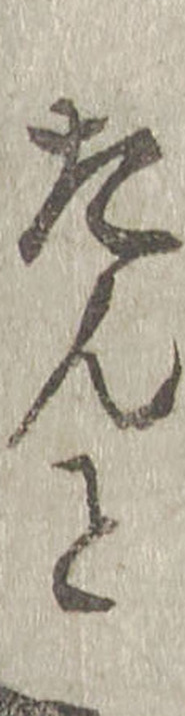たんと
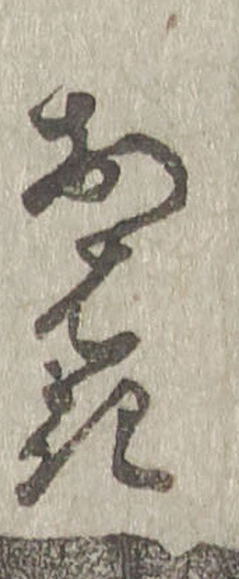おはき
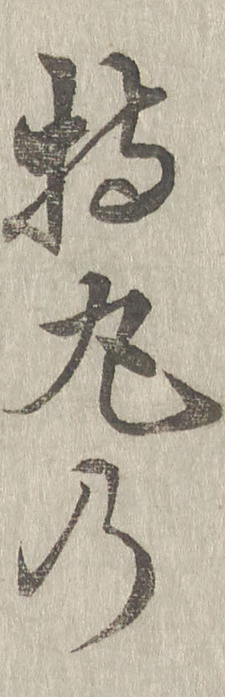持丸の
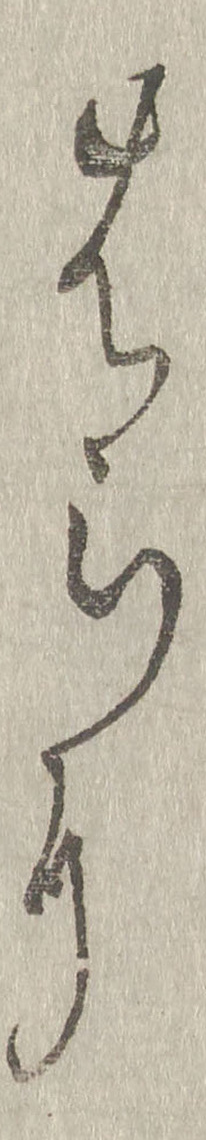はらに
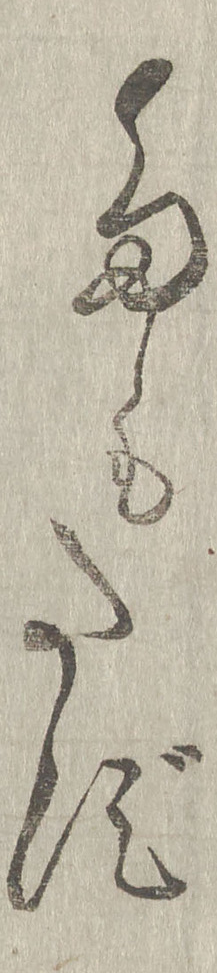たもたず
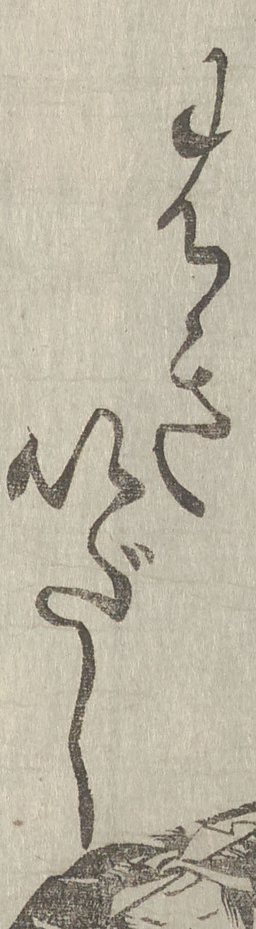いだし
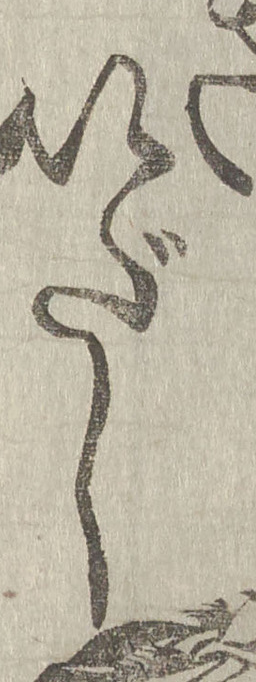いだし
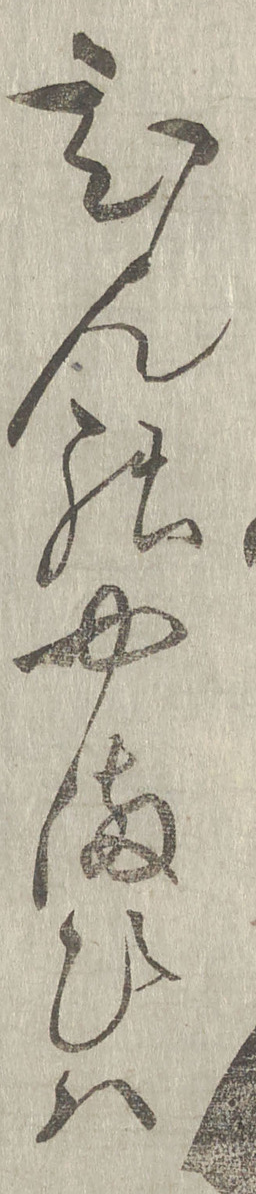ひんのやまひは
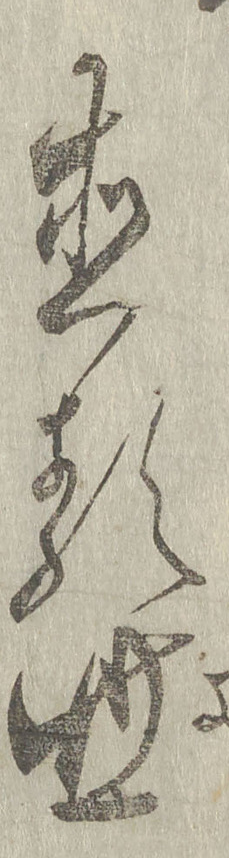直る世
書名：持丸のはらにたもたずはきいだしひんのやまひはこれで直る世
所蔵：東京大学総合図書館 General Library in the University of Tokyo, JAPAN
